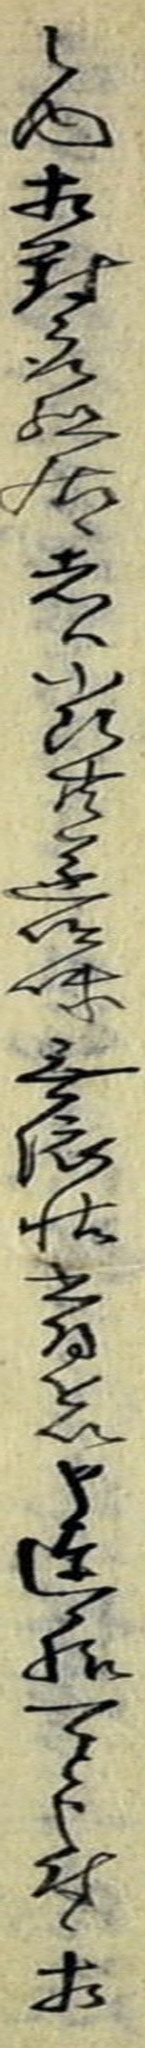之内相対取組居候者は小頭共遂吟味無依怙書付を以申達候様可被申付候相
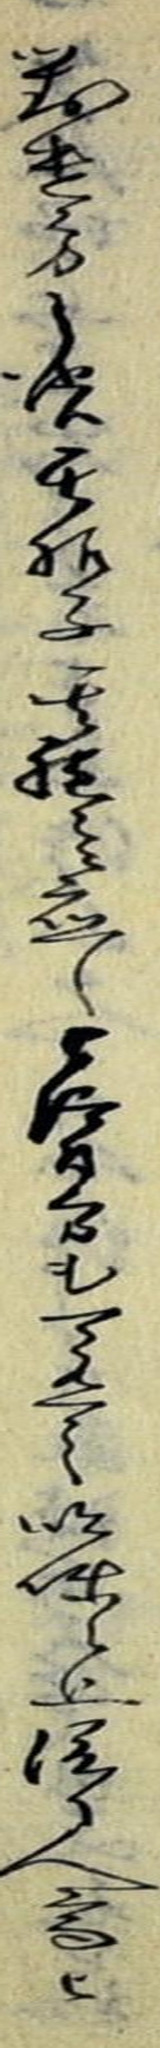対遣方之儀は其様子其程々に応し被仰付旨も可有之吟味之上渡り人高被
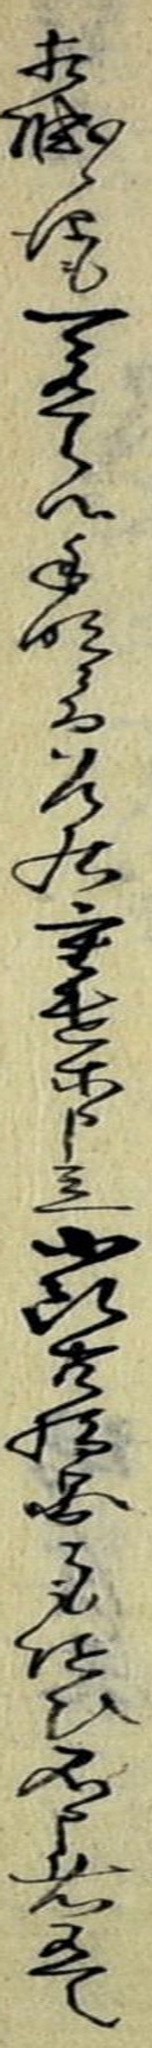相減候儀も可有之候手明に而乍居気遣等申立小頭共指図にも随ひ不申者有之
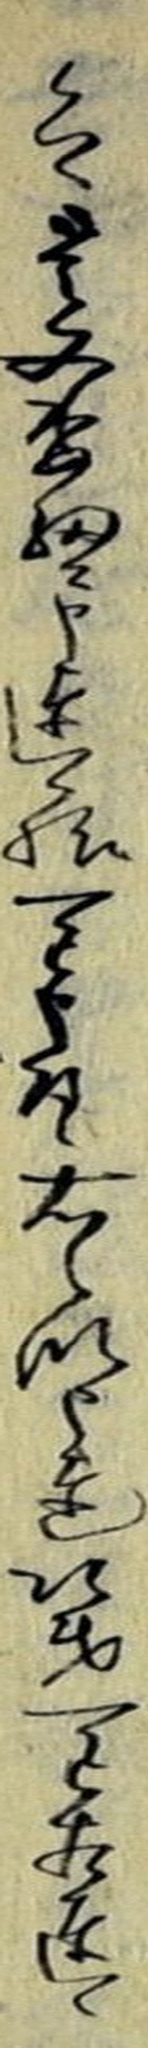候はヽ是又委細に申達候様可被申付候右之段申達次第可被相達候
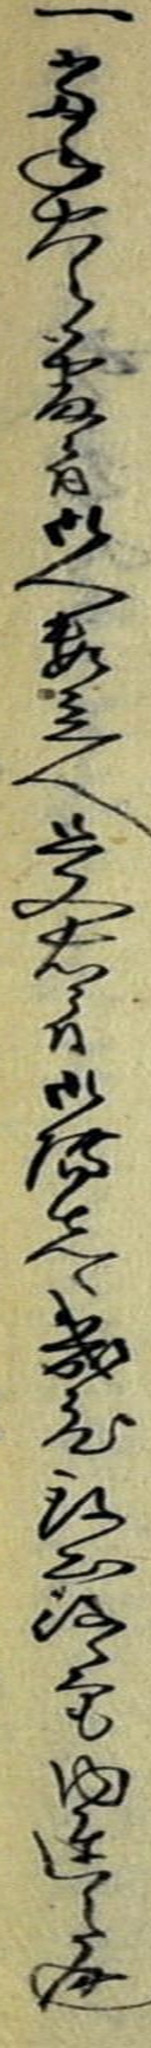一当年火之御番に付御人数立人且又右に付御防先へ幾度致出役候而も内達之通
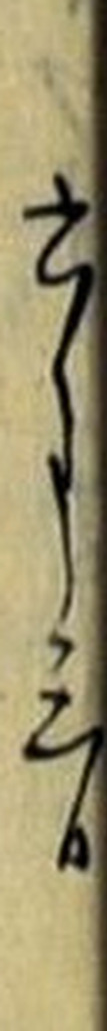六月三日
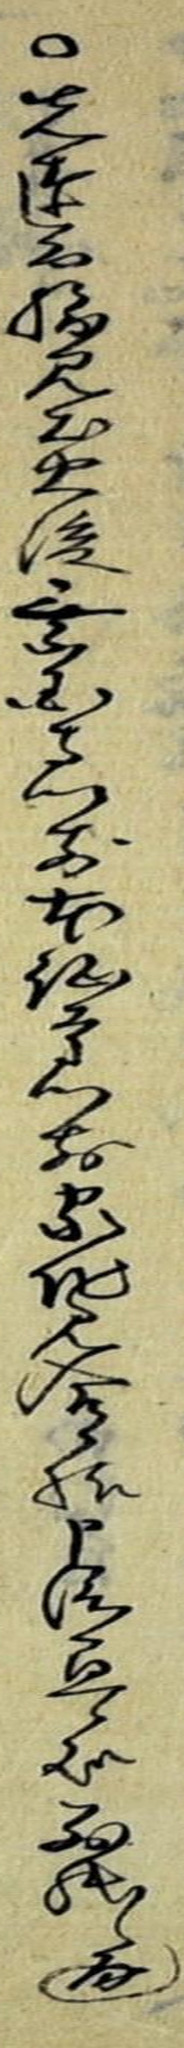○先達而勝見出火後乗国寺門前本証寺門前家作見合候様申渡置候処別紙之通
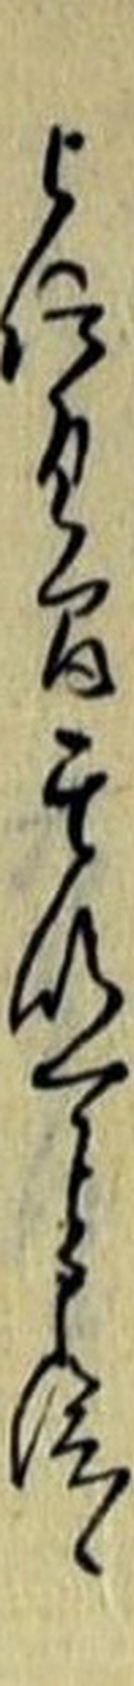被仰付候間其段可被申渡候
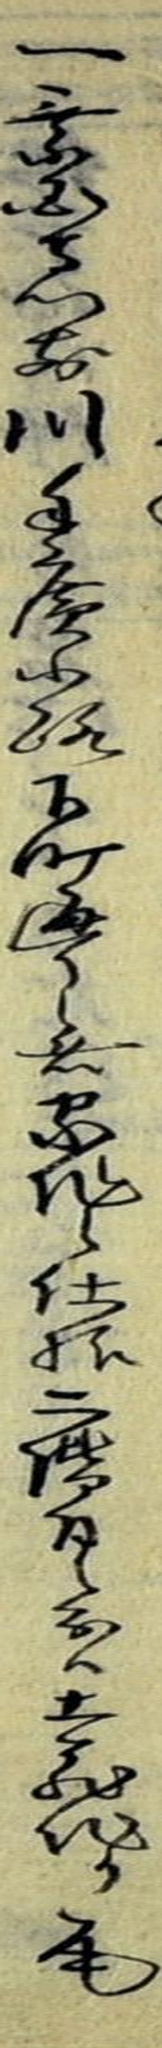一乗国寺門前川手広小路下町通り之者家作仕様二階付之分は土蔵作り瓦
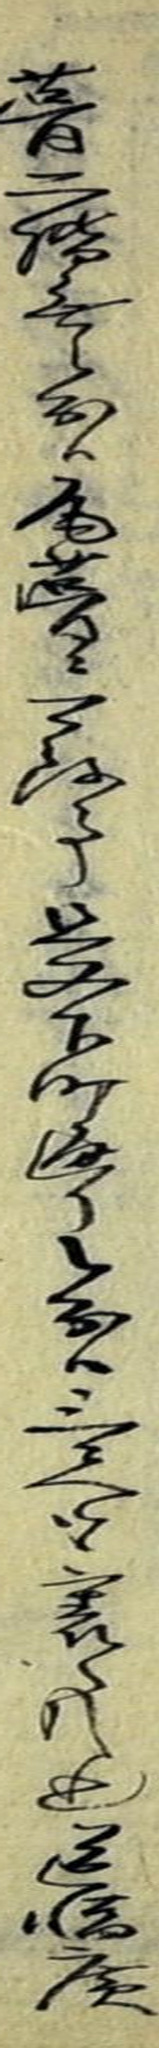葺二階無之分は瓦葺に可致事且又下町通り之分は三尺つヽ裏へ引込道幅広
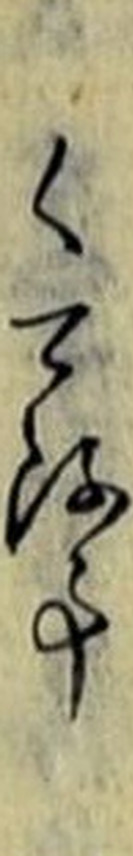く可致事
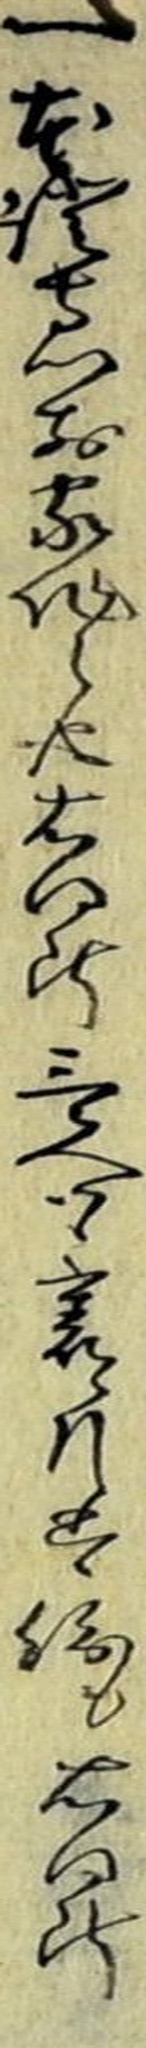一本證寺門前家作之儀右同断三尺つヽ裏へ引込候儀も右同断
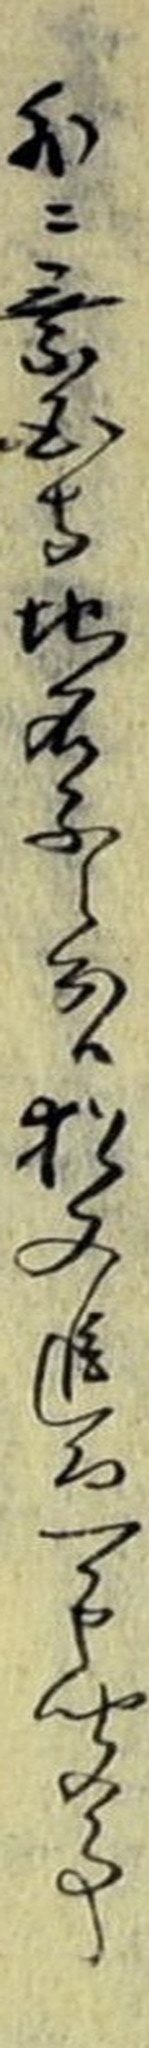外に乗国寺地名子之分は猶又追而可申聞事
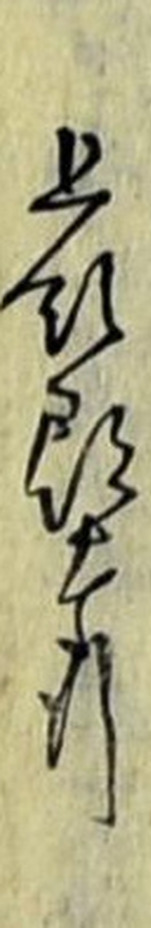上領郡奉行
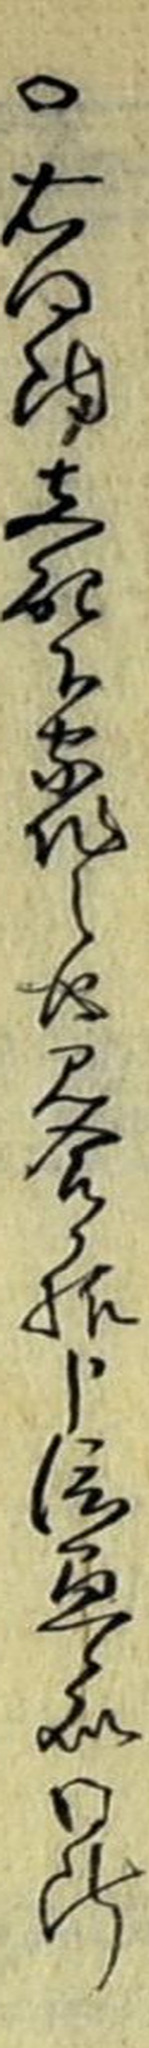○右同断支配下家作之儀見合候様申渡置候同断
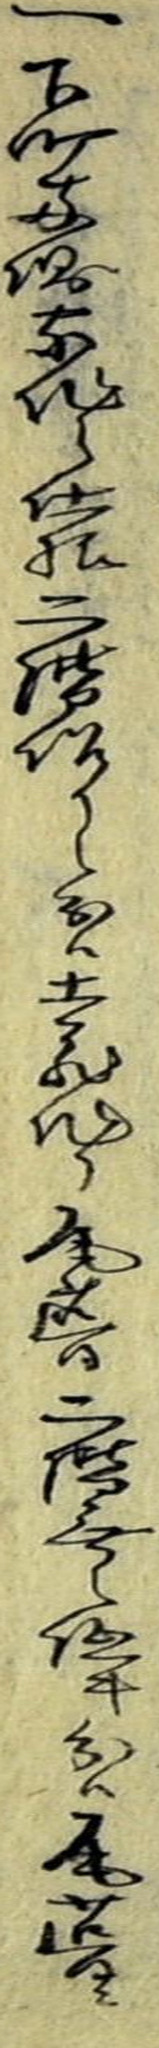一下町両側家作之仕様二階作り之分は土蔵作り瓦葺二階無之軽キ分は瓦葺に
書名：命令之部 四
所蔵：福井県文書館 Fukui Prefectural Archives
